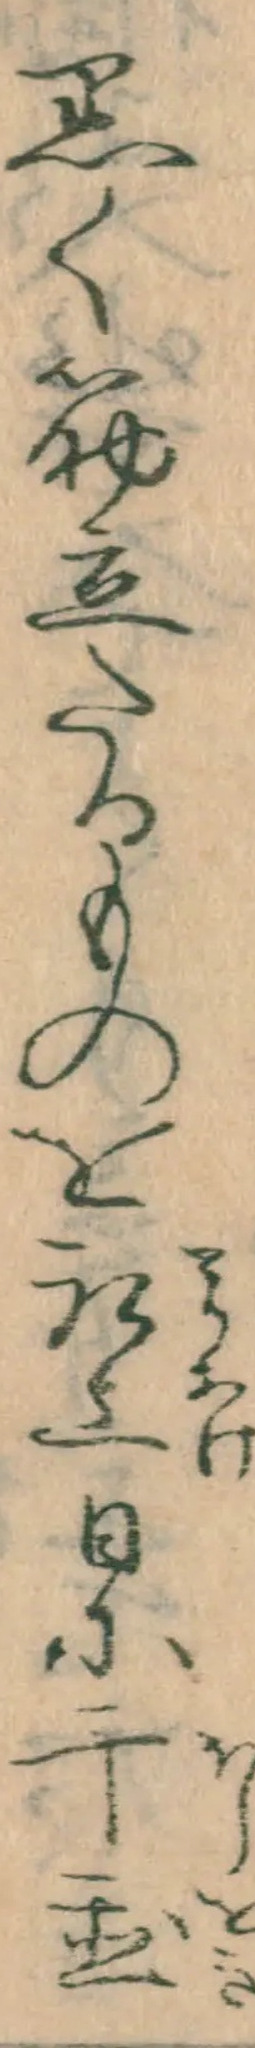黒く筋立たるものを取上日に干置
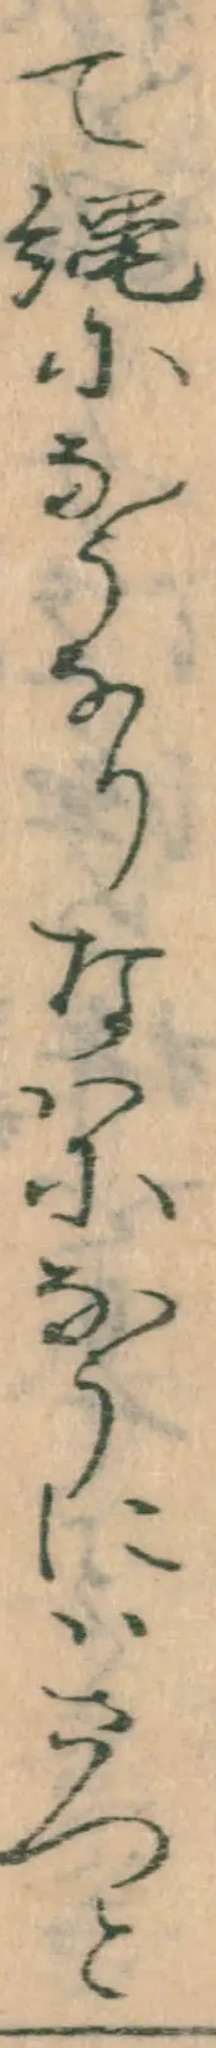て縄になうなりなはになうにはさつと
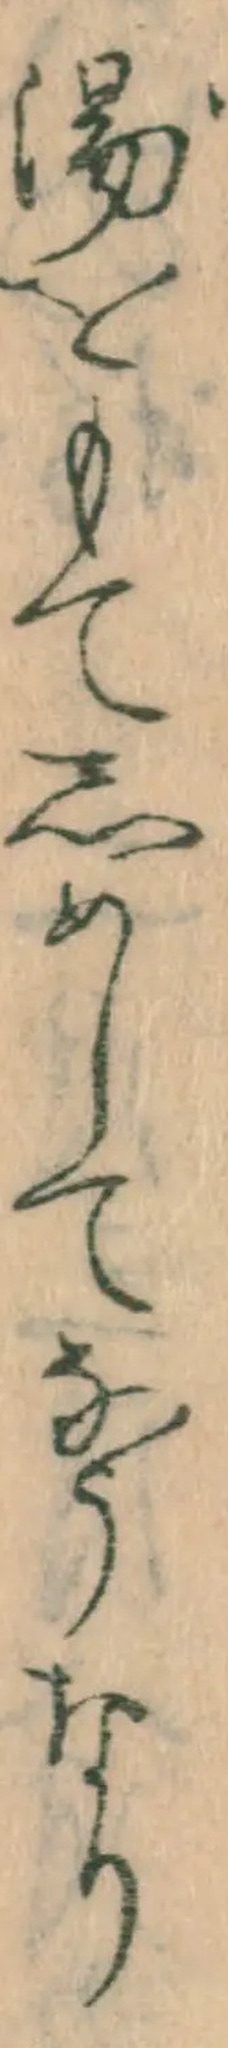湯をもてしめしてなうなり
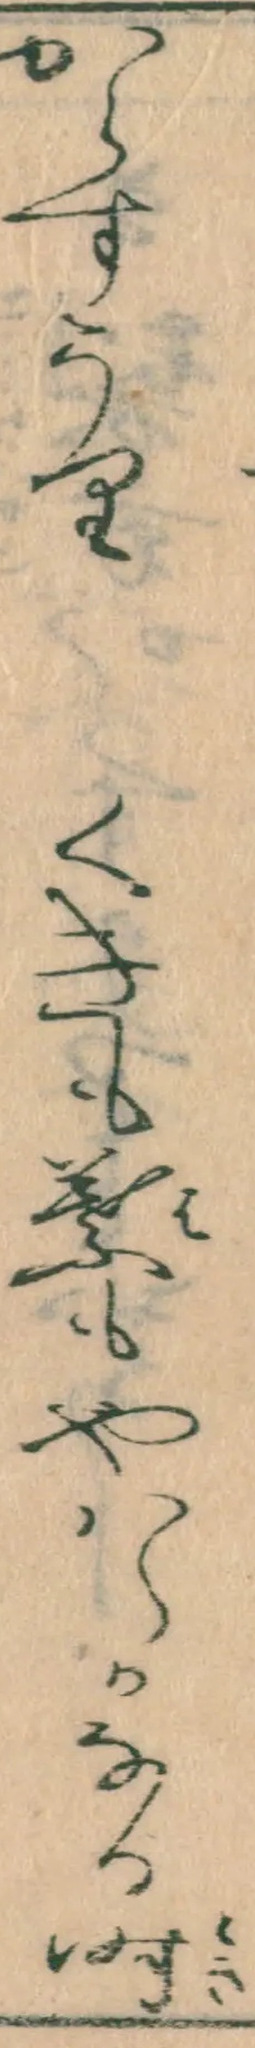からすうりくきも葉もやはらかなる時
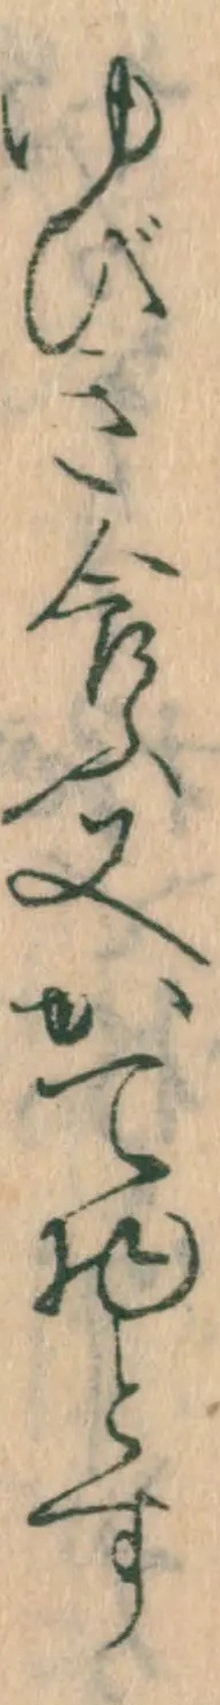ゆびき食ふ又かて物とす
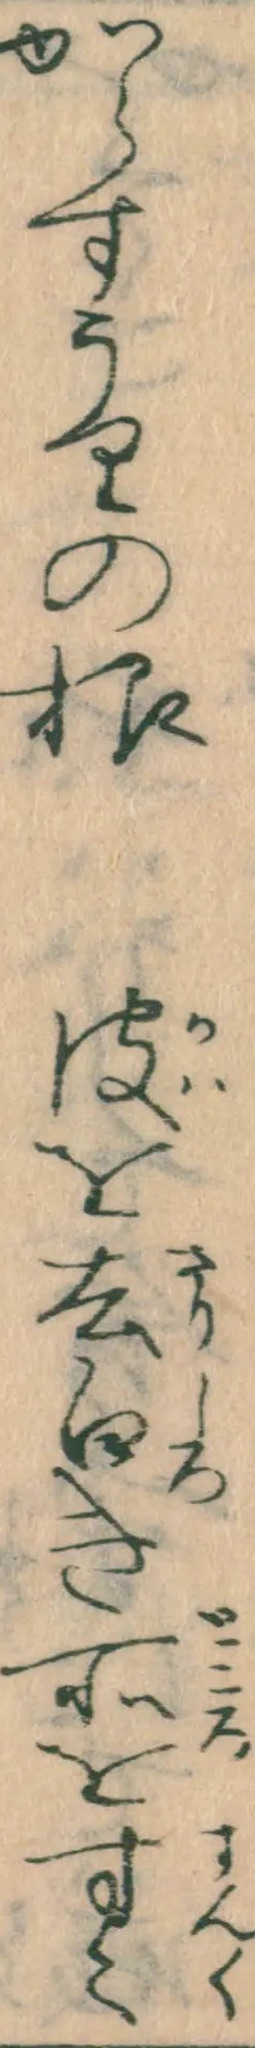からすうりの根皮を去白き所を寸々
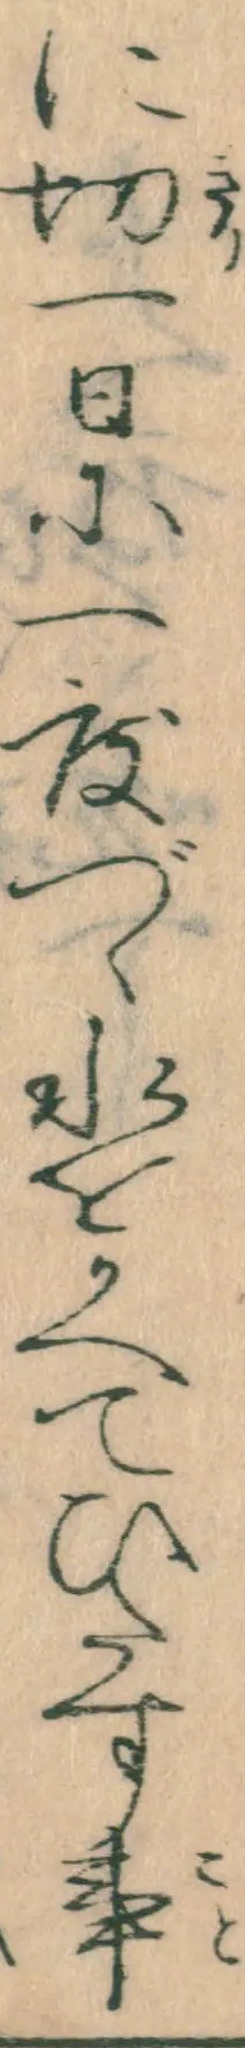に切一日に一度づゝ水をかへてひたす事
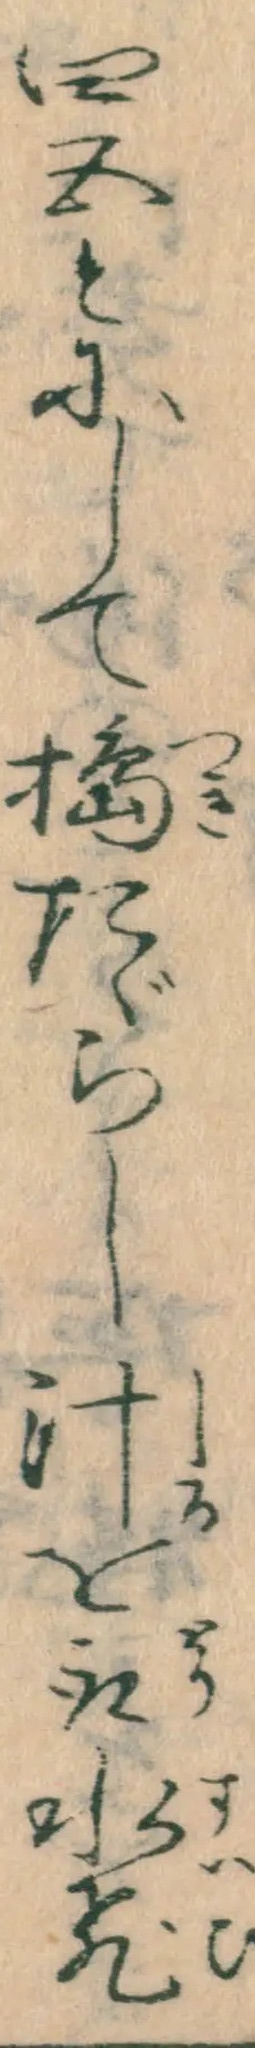四五とにして搗たゞらし汁を取水飛
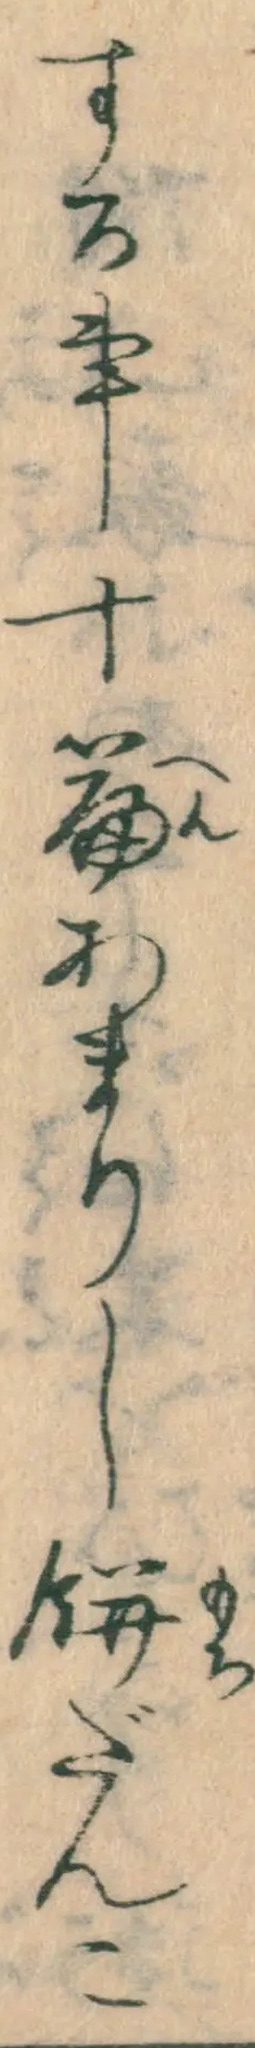する事十篇あまりし餅だんこ
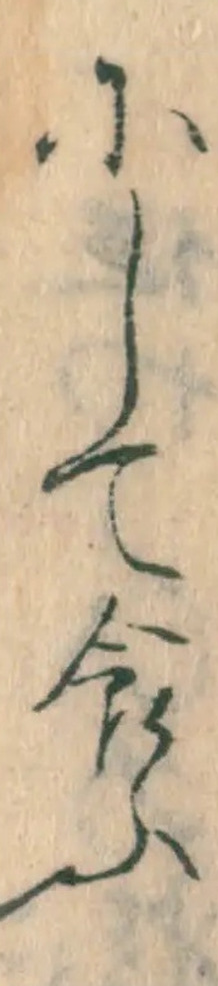にして食ふ

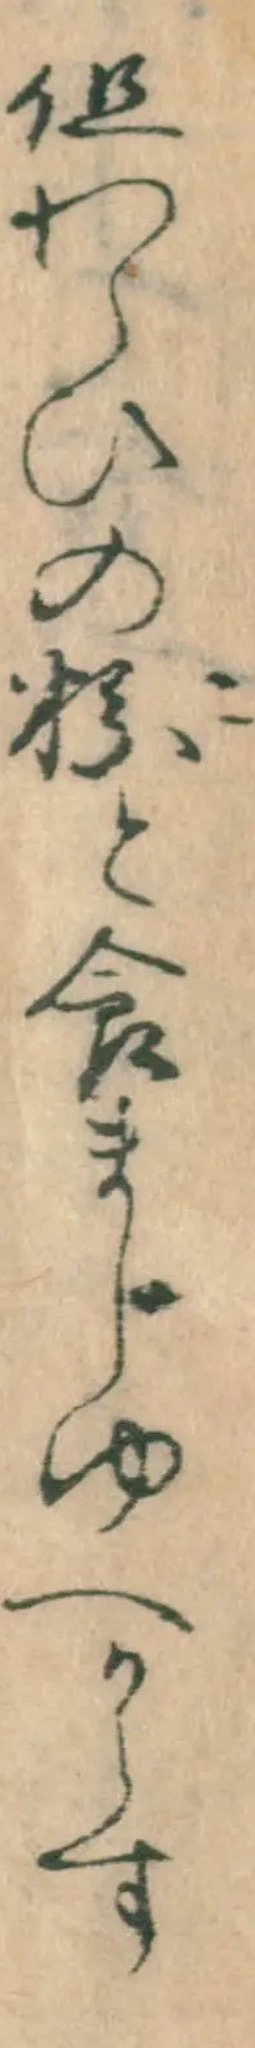但わらひの粉と食まじゆへからす
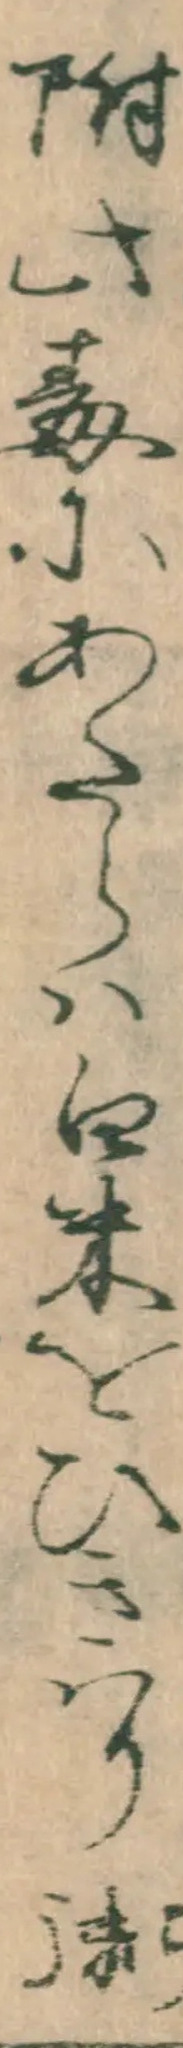附此毒にあたらは白米をひきわり粥
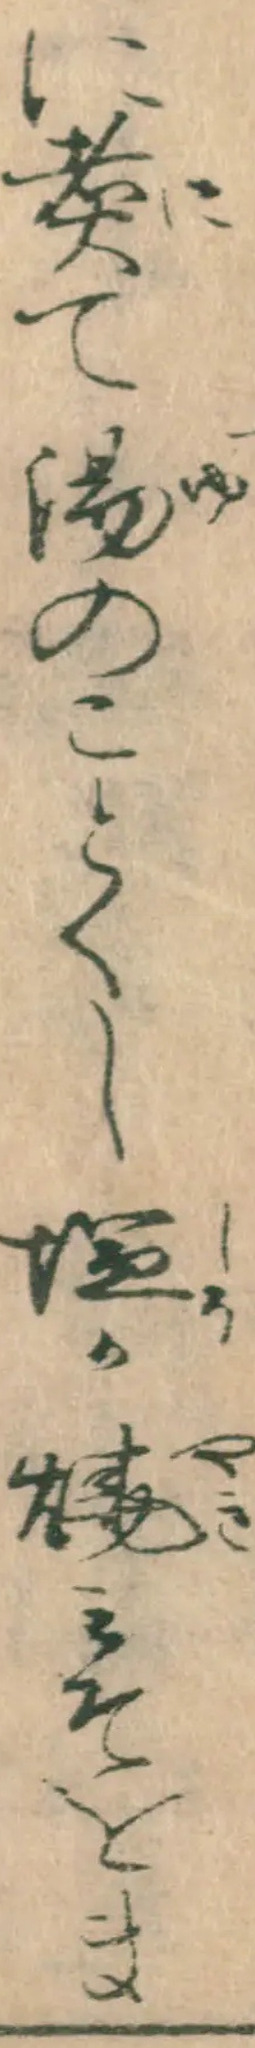に煮て湯のことくし塩か焼みそをま
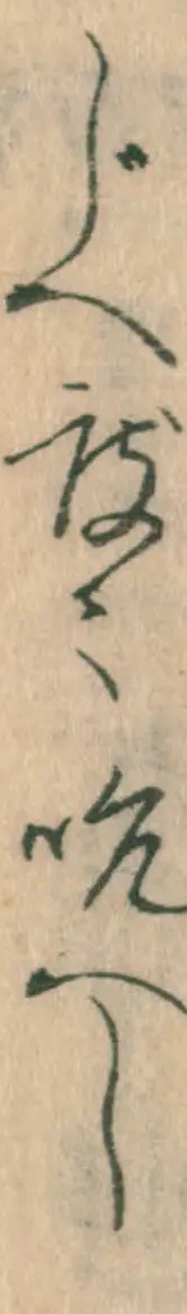じへ度々吮へし
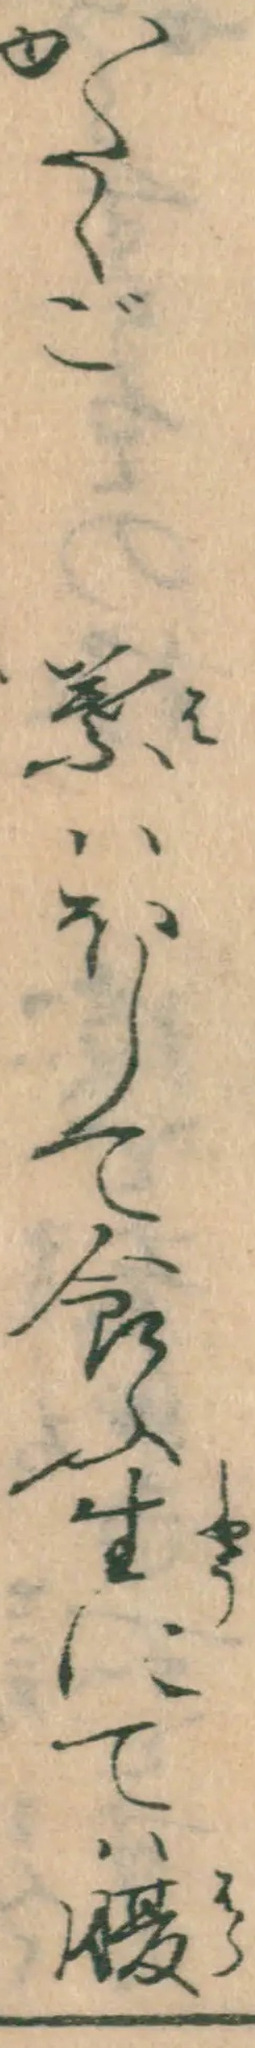かたゝご葉はほして食ふ生にては腹
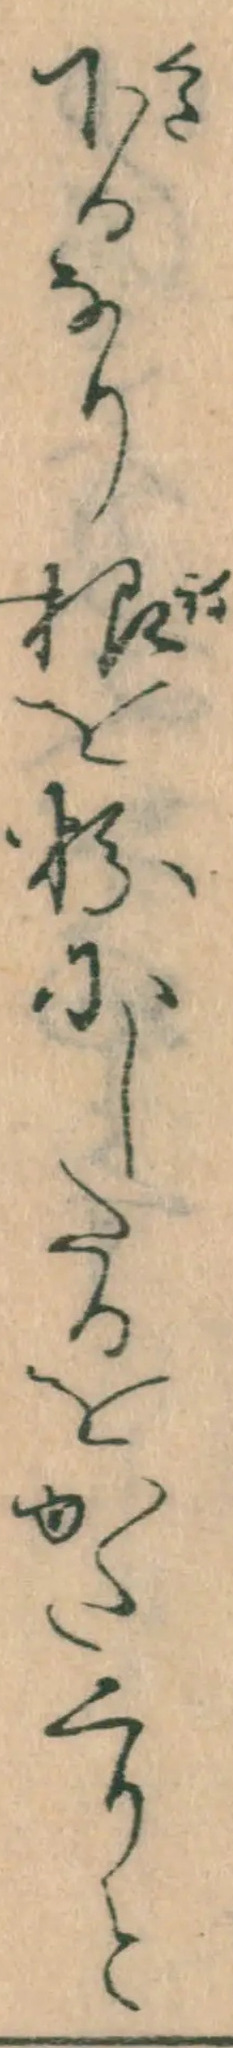下るなり根を粉にしたるをかたくりと
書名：かてもの
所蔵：国立国会図書館 National Diet Library, JAPAN
